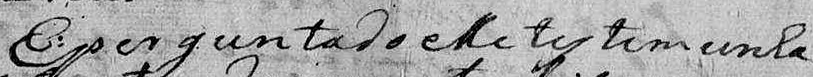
E perguntado elle testemunha
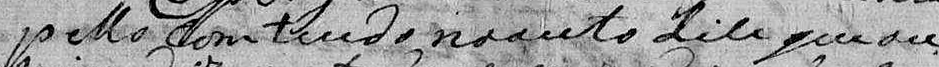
pello Comteudo no auto dice que ou
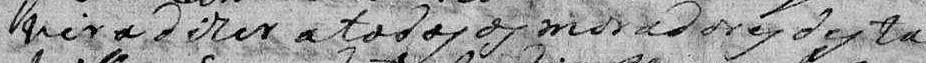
vira dizer a todos os moradores desta
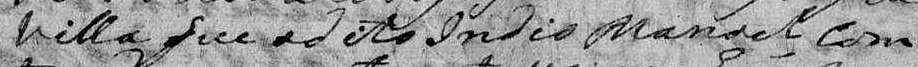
villa que o dito Indio Manoel com
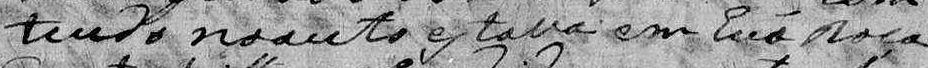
teudo no auto estava em huā Roça
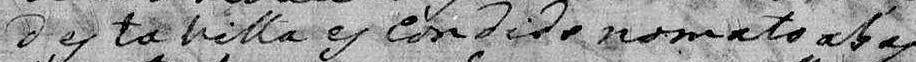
desta villa escondido no mato abas
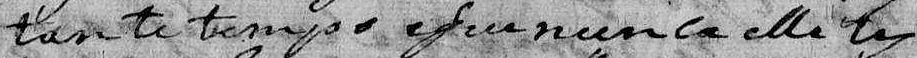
tante tempo e que nunca elle tes
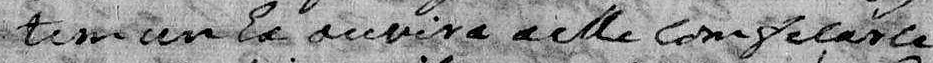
temunha ouvira a elle comfeçarce
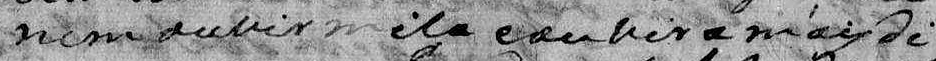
nem ouvir miça e ouvira mais di
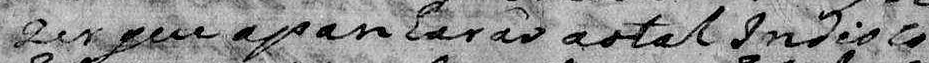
zer que apanharaõ ao tal Indio co
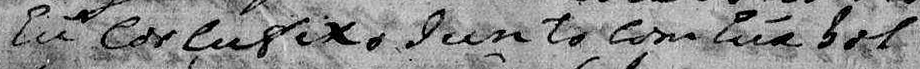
hū corçufixo Iunto com huā bol
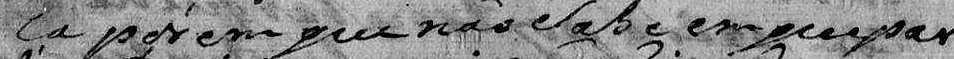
ça porem que naõ sabe em que par
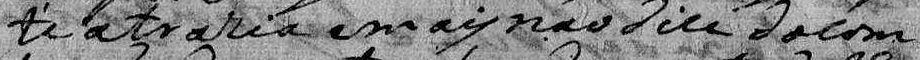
te a trazia e mais naõ dice do com
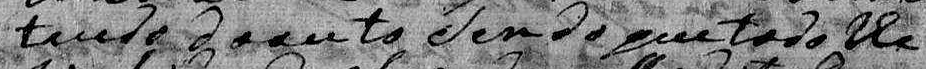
teudo do auto sendo que todo lhe
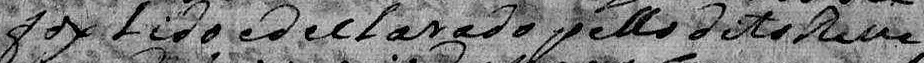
foy Lido e declarado pello dito Reve
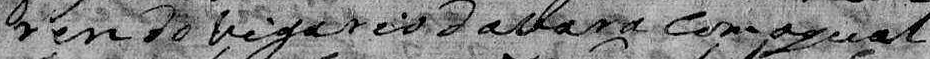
rendo vigario da vara com o qual
